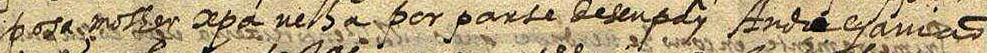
posa molher xpā uelha por parte de seu paŷ Andr_ Gauiaõ
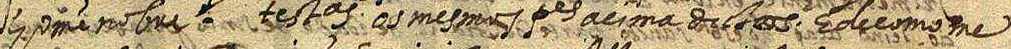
homē nobre : testas. os mesmo pes acima dictos. E de como me
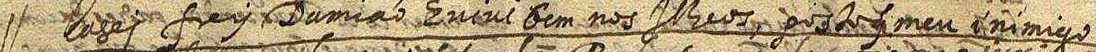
casej frey Damiaõ E uiui bem nos Jlheos, posto q̄ meu inimigo
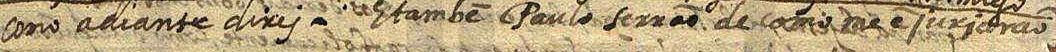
como adiante direj - E tambē Paulo serrão de como me ējuriaraõ
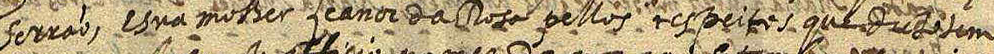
Serraõ, e sua molher Leanor da Rosa pellos respeitos que dicto tem
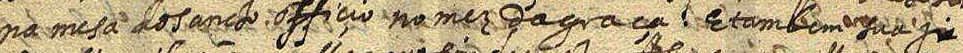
na mesa do sancto offiçio no mez da graça : E tambem sua jr
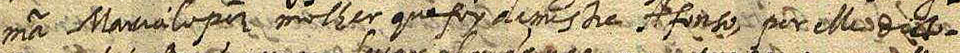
mã Maria lopēz molher que foy de mestre Afonso, por elle dicto -
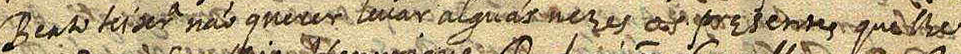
Bento teixra naõ querer leuar alguās uezes os prEsentes que lhe
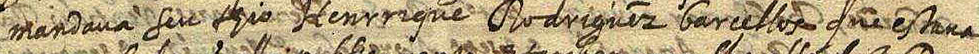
mandaua seu thio Henrrique Rodriguēz barcellos que estaua
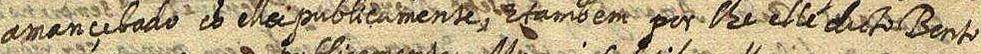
amançebado cō ella publicamente, E tambem por lhe elle dicto Bento
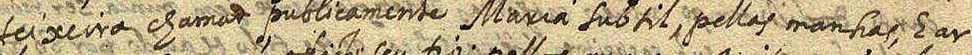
teixeira chamar publicamente Maria Subtil, pellas manhas, E ar
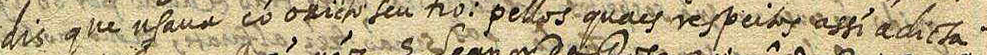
dis que usaua cō o dicto seu tio : pellos quaes respeitos assī a dicta
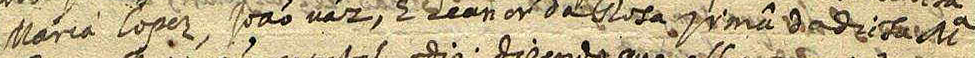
Maria lopez, Joaõ uāz, E Leanor da Rosa jrmā da dicta Ma
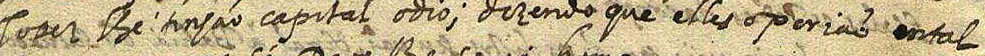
lopez lhe tinhaõ capital odio; dizendo que elles o poriaõ en tal
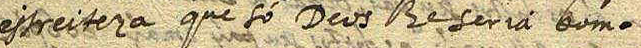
estreiteza que só Deos lhe seria bom.
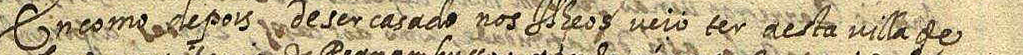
En como depois de ser casado nos Jlheos ueio ter a esta uilla de
